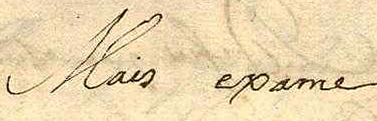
Mais exame
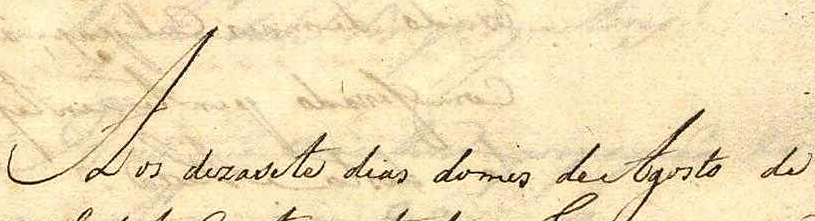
Aos dezasete dias do mes de Agosto de
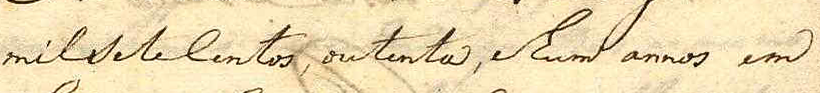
mil SeteCentos, outenta, e hum annos em
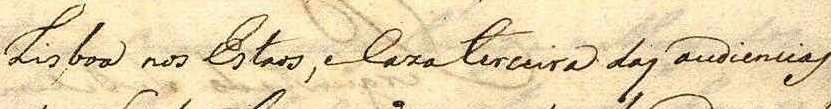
Lisboa nos Estaos, e Caza terceira das audiencias
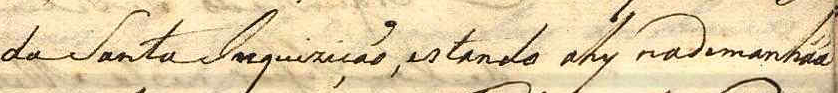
da Santa Inquiziçaõ, estando ahy na de manhaã
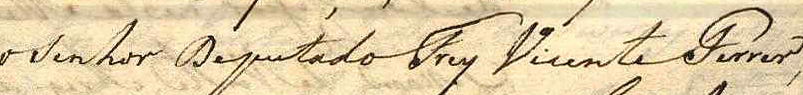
o Senhor Deputado Frey Vicente Ferrer,
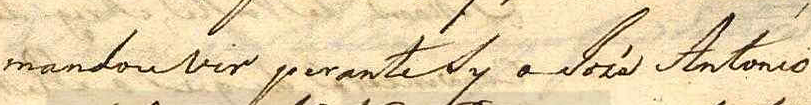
mandou vir perante Sy a Iozé Antonio
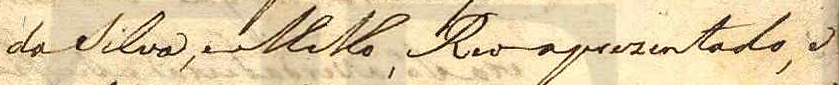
da Silva, e Mello Reo aprezentado, e
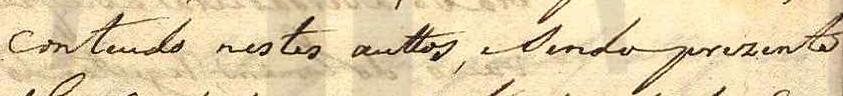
conteudo nestes auttos, e Sendo prezente
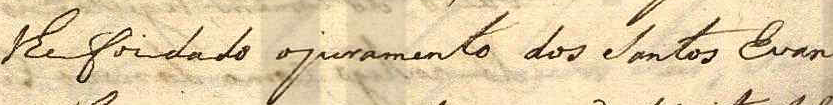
lhe foi dado o juramento dos Santos Evan
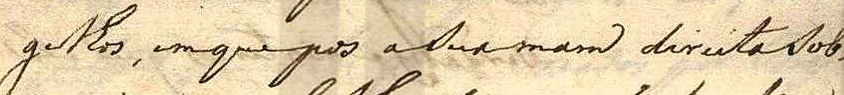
gelhos, em que pos a Sua mam direita sob
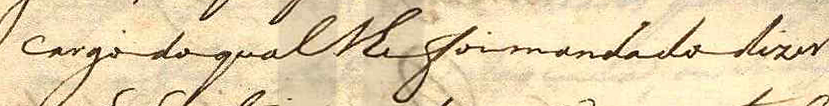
cargo do qual lhe foi mandado dizer
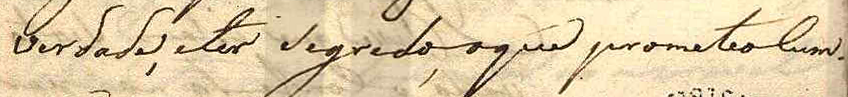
verdade, e ter segredo, o que prometeo Cum
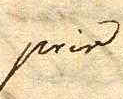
prir.
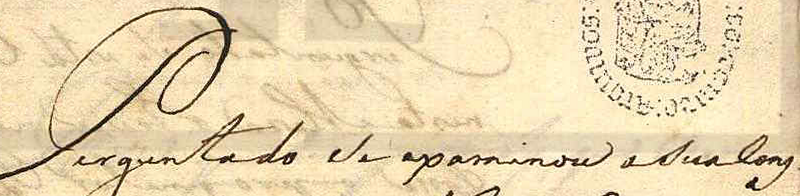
Perguntado se examinou a sua cons
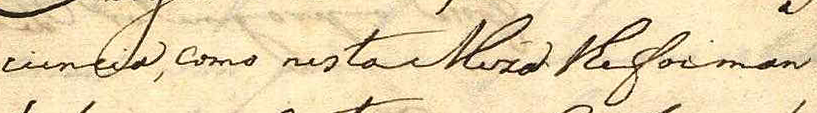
ciencia, como nesta Meza lhe foi man
